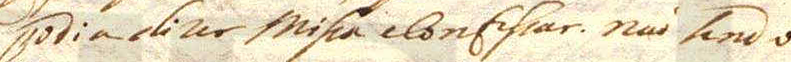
podia dizer missa e confessar naõ sendo
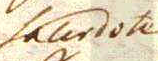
sacerdote
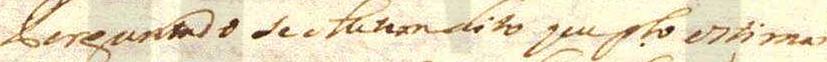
Perguntado se elle tem dito que p.lo estimare_
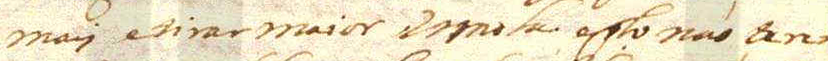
mais e tirar maior Esmola e plo naõ terem
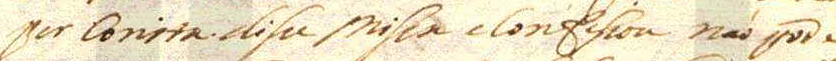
por Corista. disse missa e Confessou naõ pode
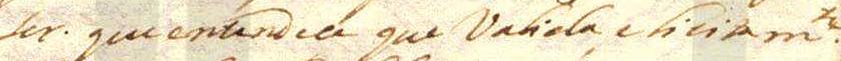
ser que entendeçe que valida, e licitamte.
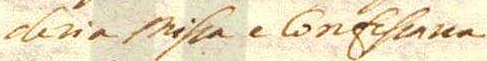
dezia missa e Confessaua.
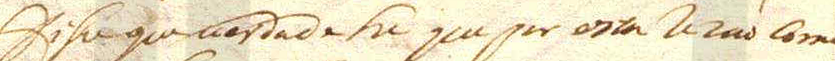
Disse que uerdade he que per esta Rezaõ come
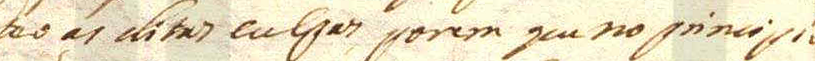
teo as ditas culpas, porem que no principio
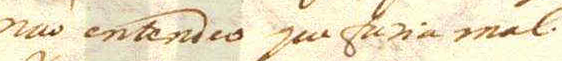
naõ entendeo que fazia mal.
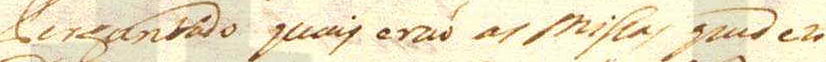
Perguntado quais eraõ as missas que dezi_
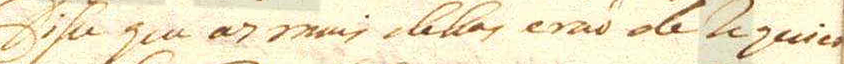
Disse que as mais dellas eraõ de Requie_
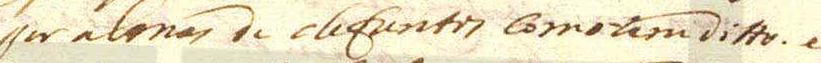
per almas de defuntos como tem ditto. e
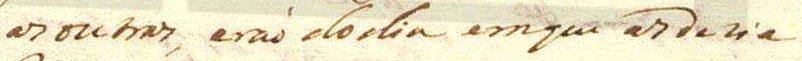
as outras, eraõ do dia em que as dezia.
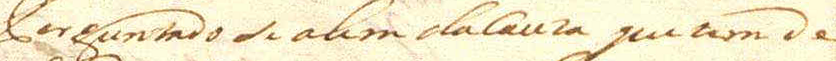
Perguntado se alem da cauza que tem de
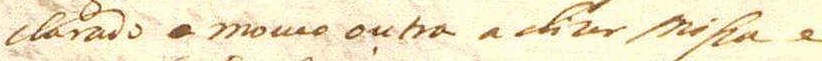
clarado o moueo outra a dizer missa e
